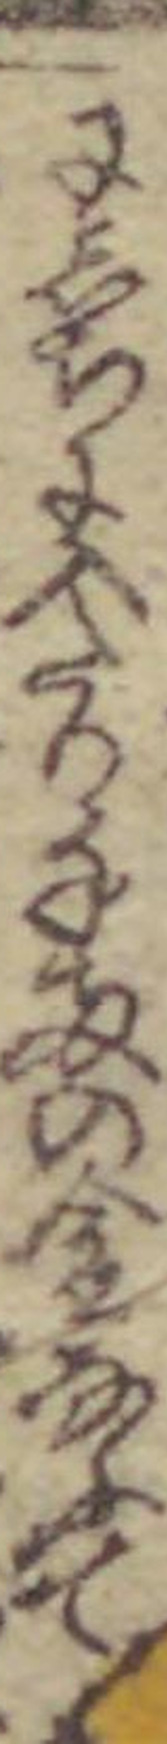にしちに入たり千両の金なふて
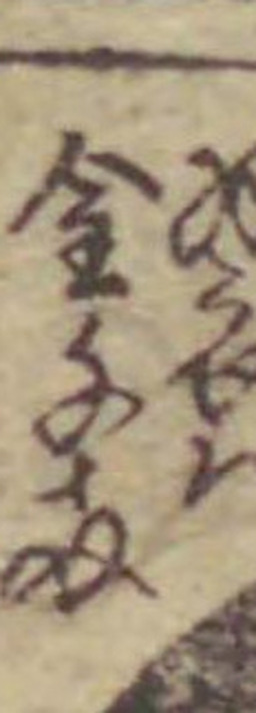金千両
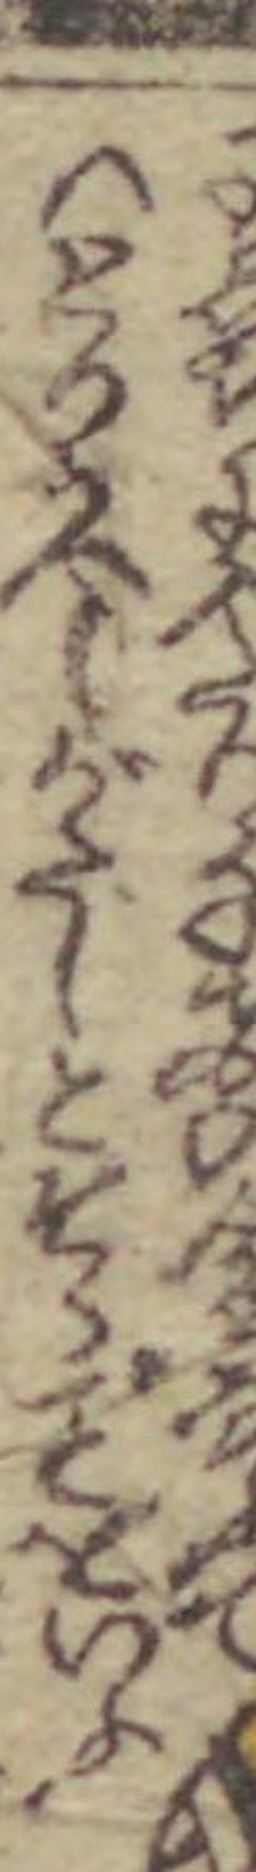はとりかへしがたしとそらことをいふ
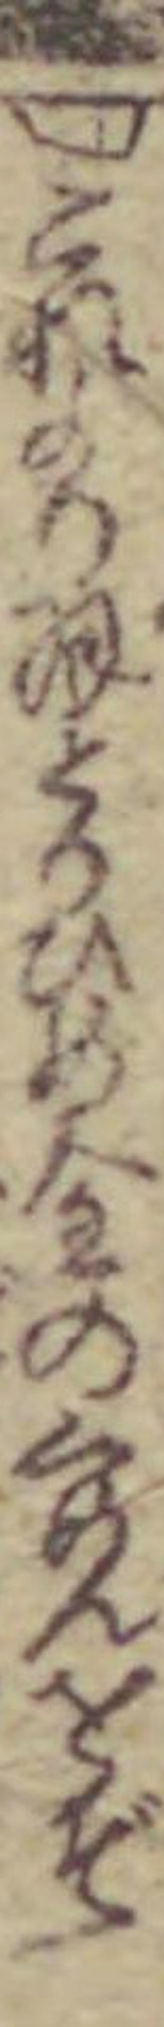これより羽とりひめ金のくめんをぞ
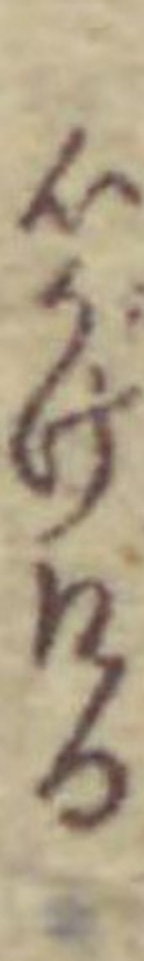心がけける
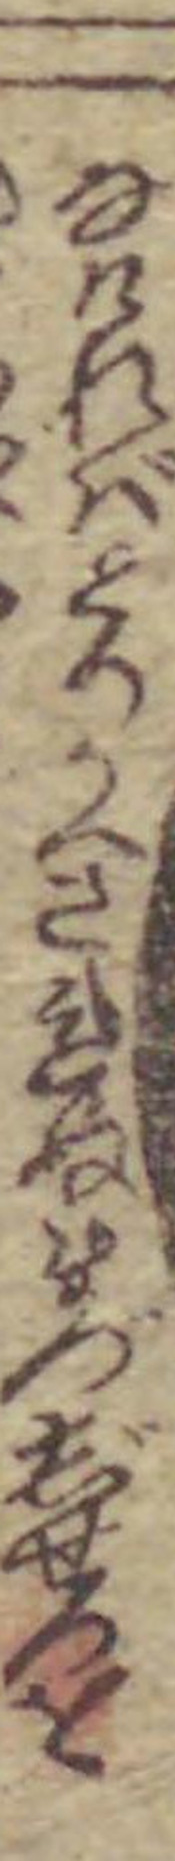なければとりかへされぬまづじせつを
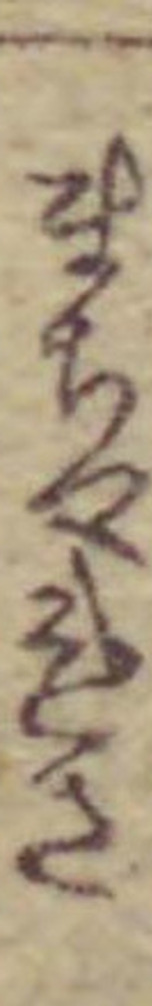まちやれさ
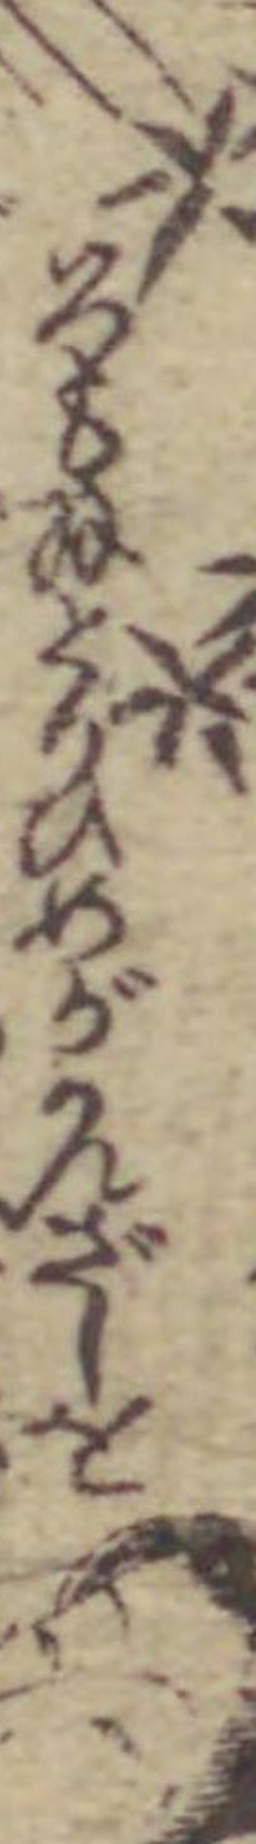いつも羽とりひめがかんざしを
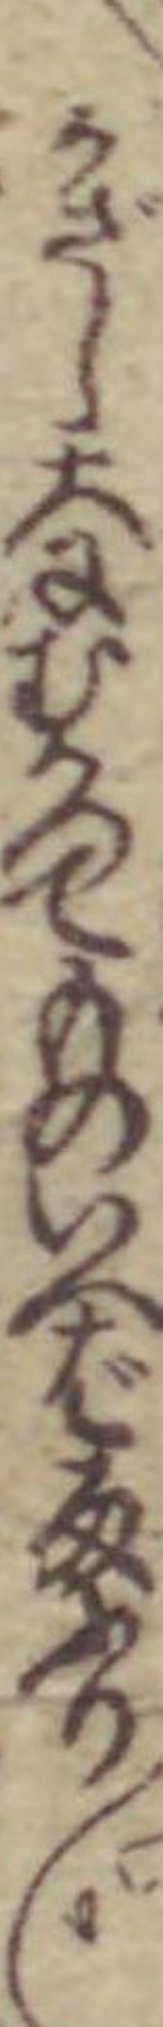かざし天にむかつてものいへば雨ふり
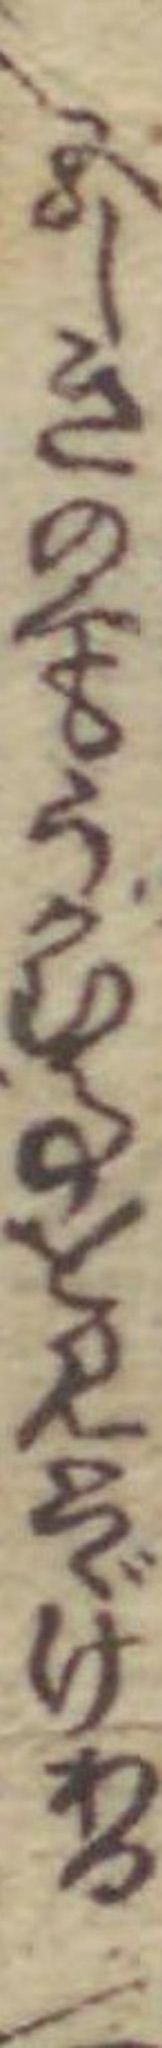五しきのくもうかむ事を見とゞけある
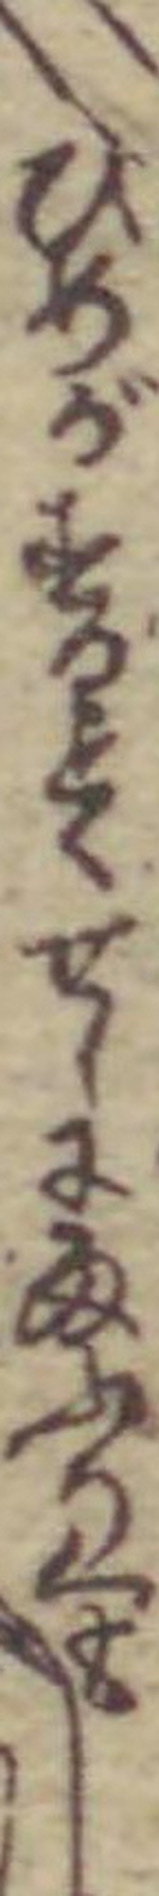ひめがすることくせしに雨ふりくも
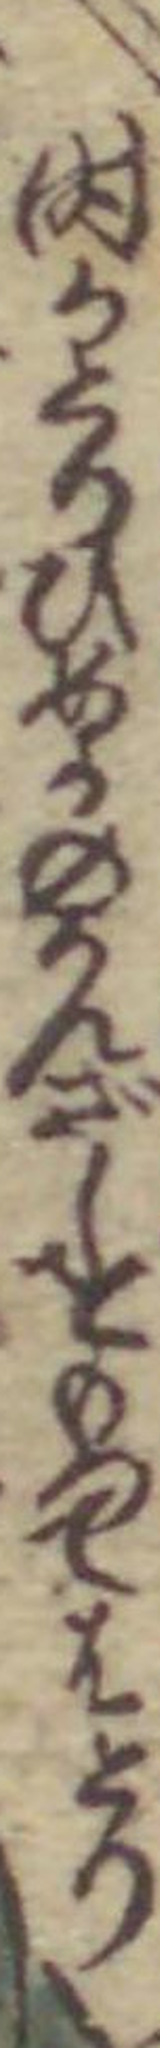時かとりひめかのかんざしをもつてはとり
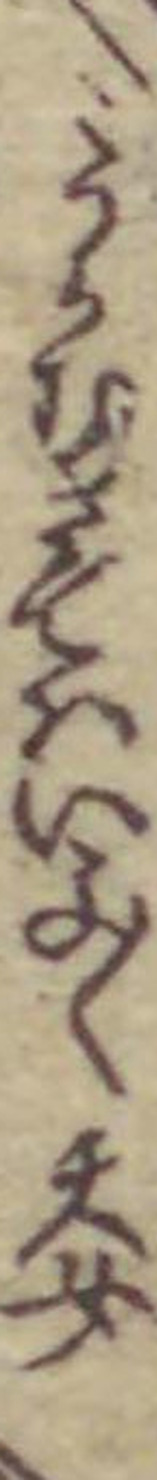うかむさてはいよ〳〵天女
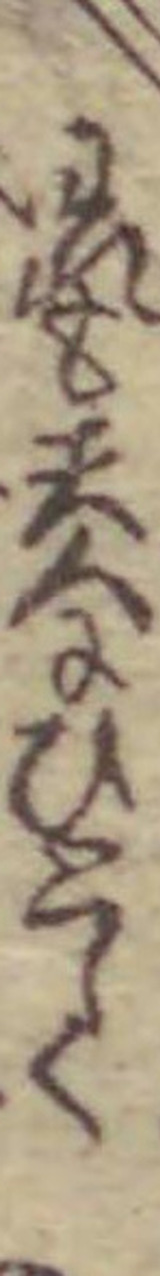われも天人にひとしく
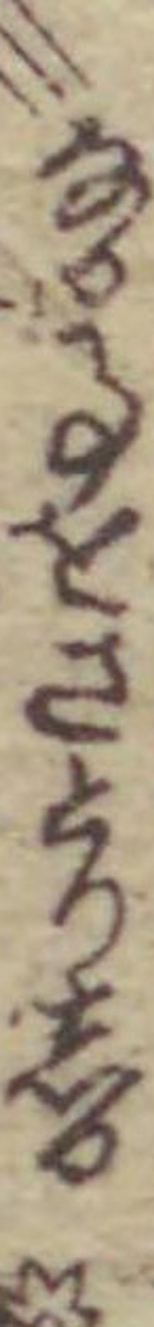なる事をさとりしる
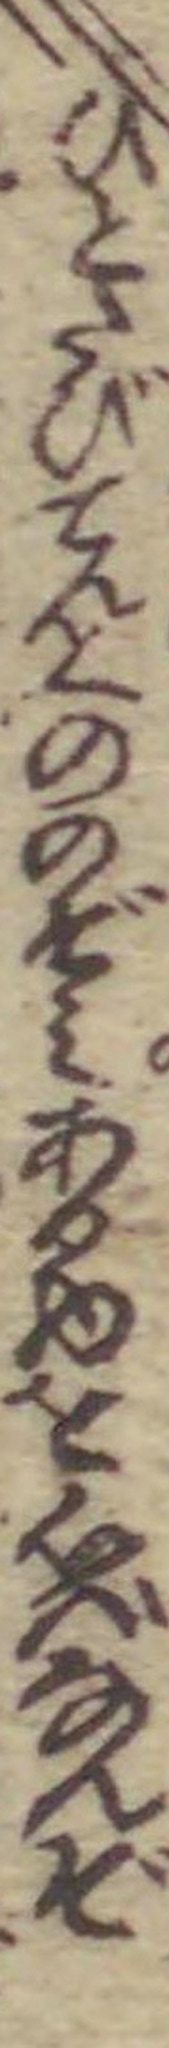ひとたびてん上ののぞみある物を心ばなんぞ
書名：娜二代鉢木 5巻
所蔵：国立国会図書館 National Diet Library, JAPAN
